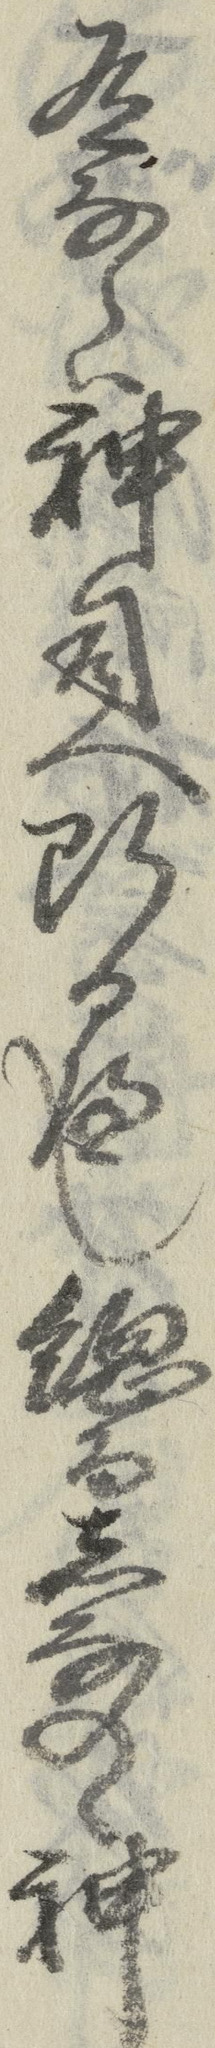有ならは神司へ断るへし総而しなのゝ神
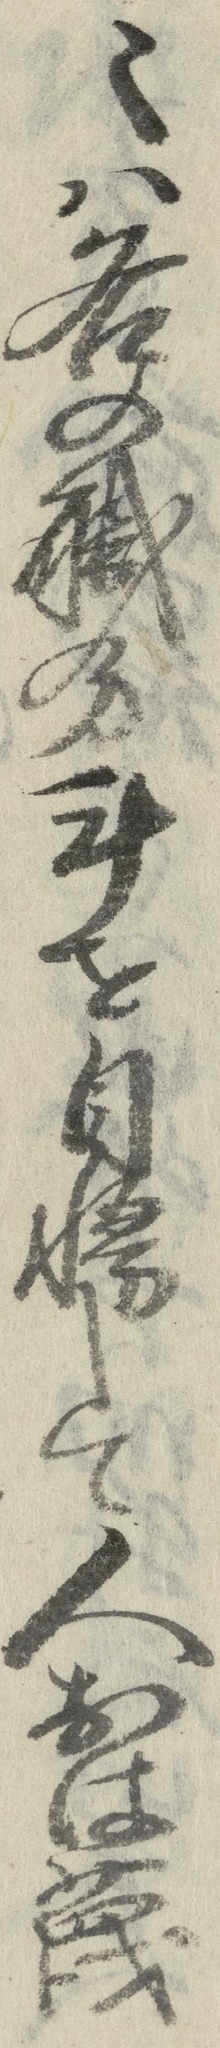々は各の職分計を自慢して人おは蔑
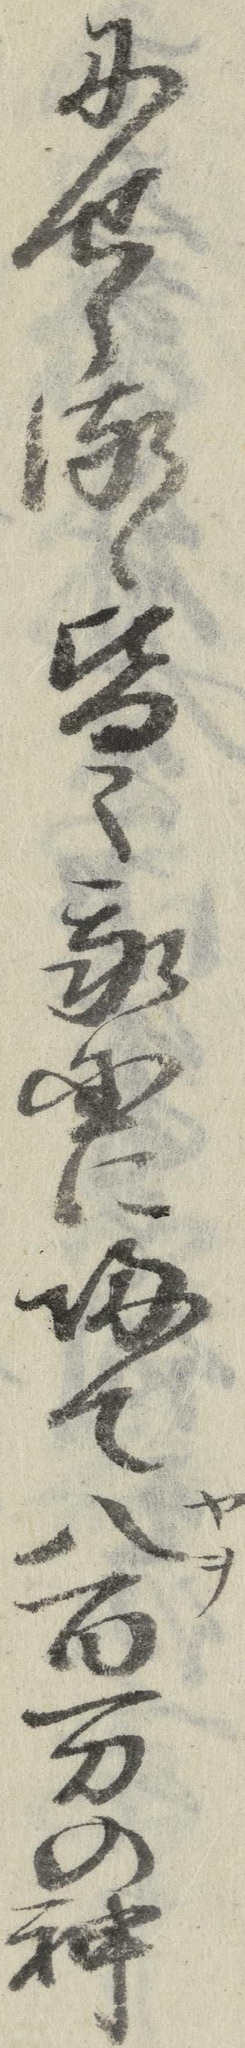にせらるゝ皆々我国に帰て八百万の神
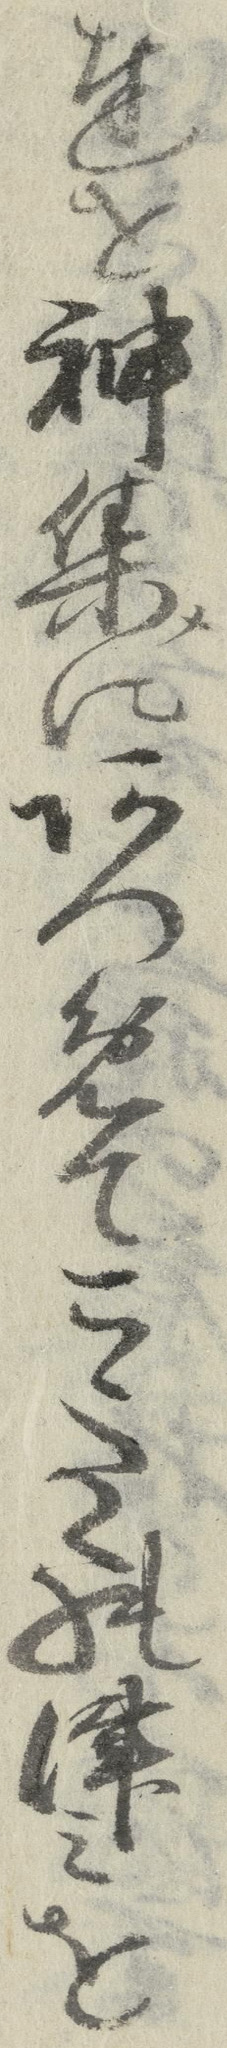達を神集ゝたくのつみを
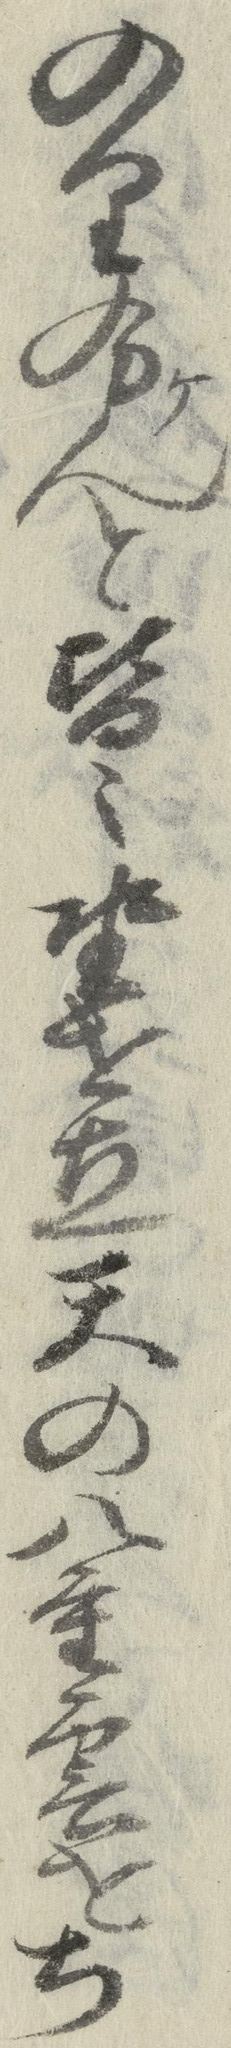のり分皆々坐を立天の八重雲をち
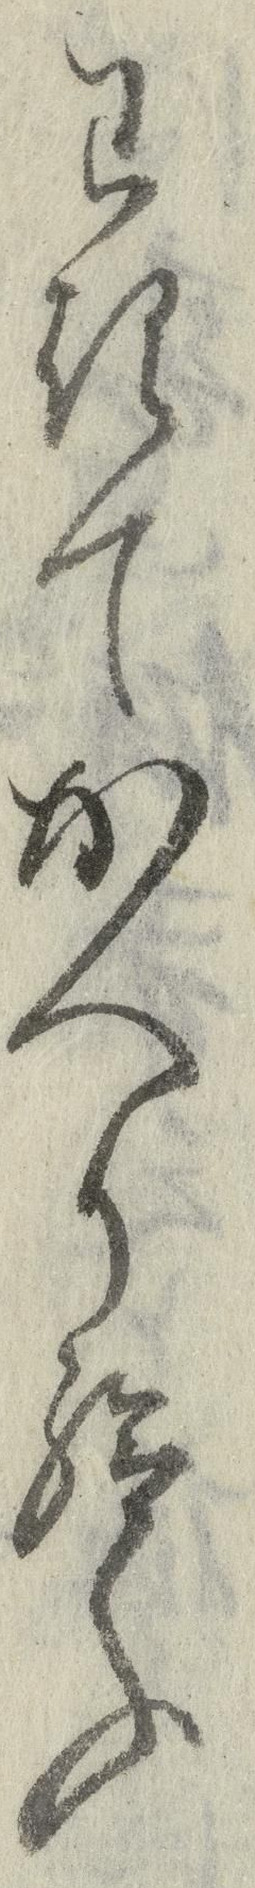わきてかへり給ふ
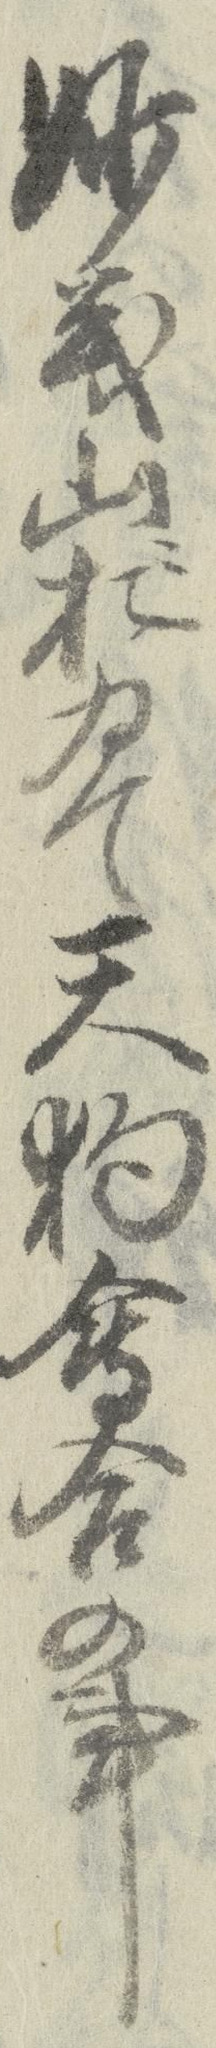妙義山におゐて天狗会合の事
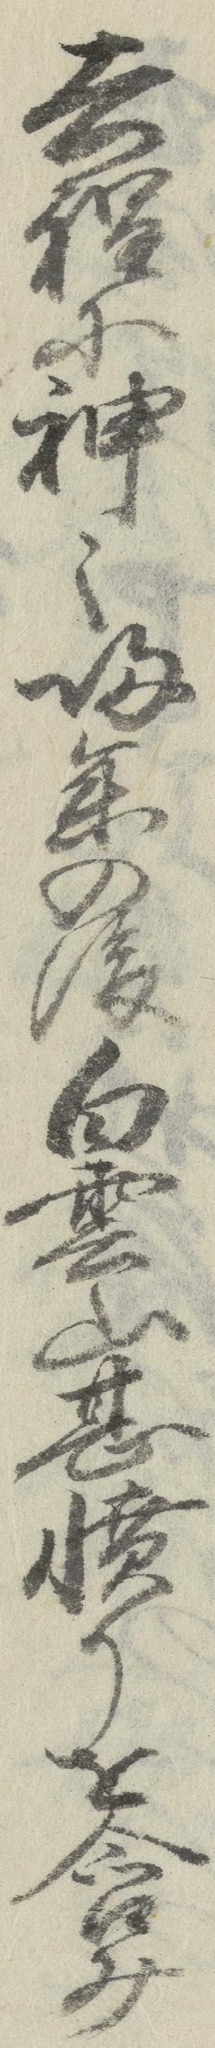去禍に神々帰参の後白雲山甚憤りを含み
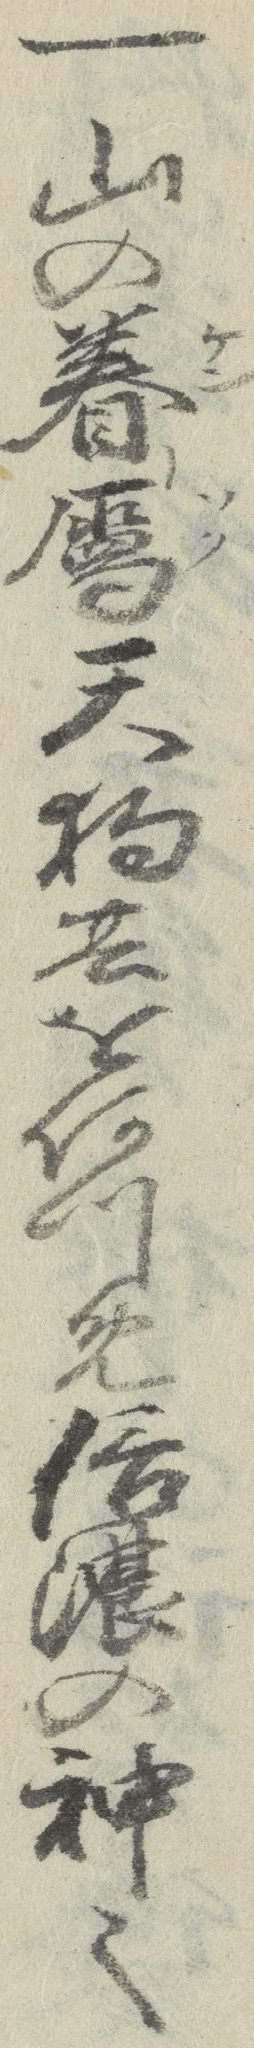一山の眷属天狗共をあつめ信濃の神々
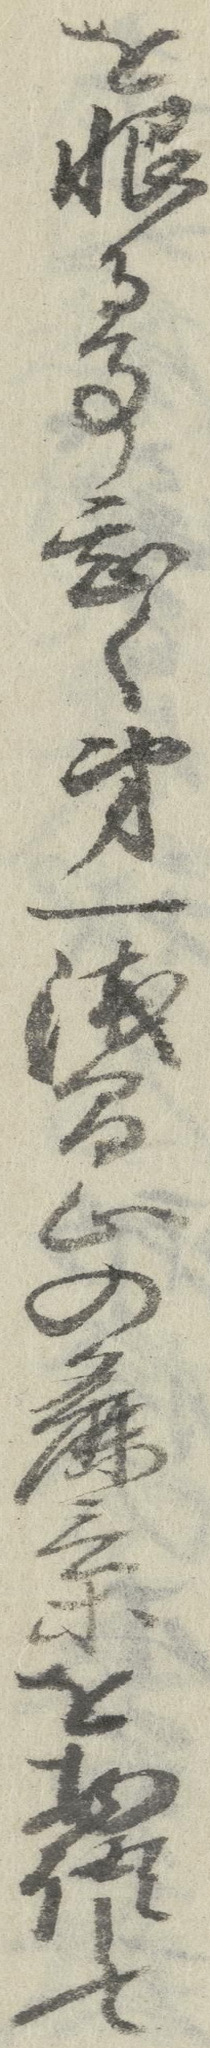を恨る事甚々第一浅間山の麁云等を物語して
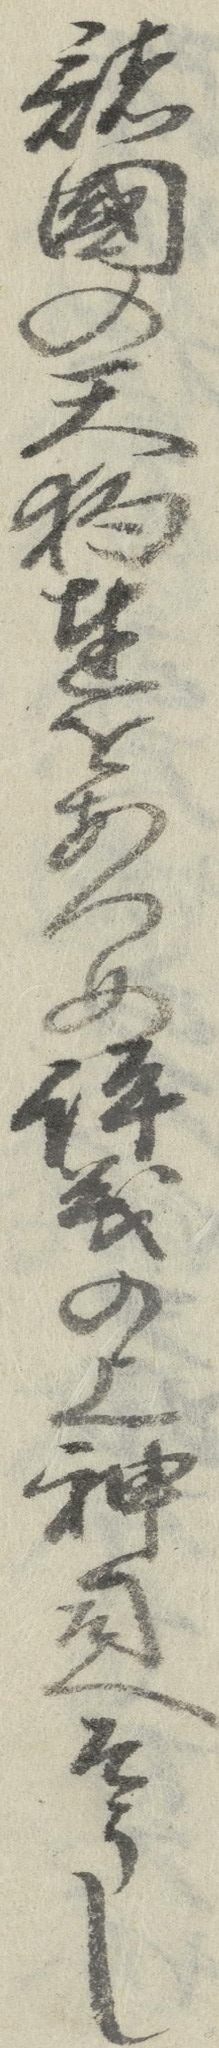諸国の天狗達をあつめ評義の上神司へそうし
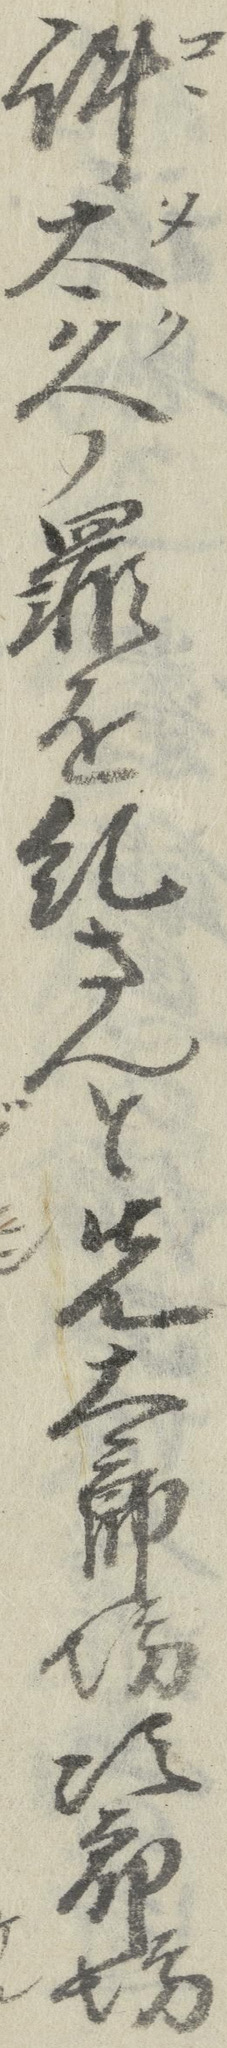件太久ノ罪を糾さんと先太郎坊次郎坊
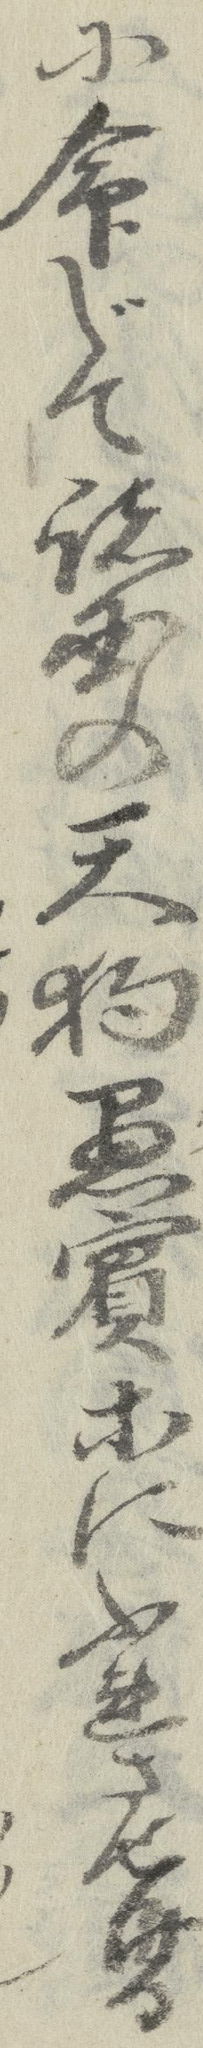に命じて諸国の天狗愚賓等にふれさせける
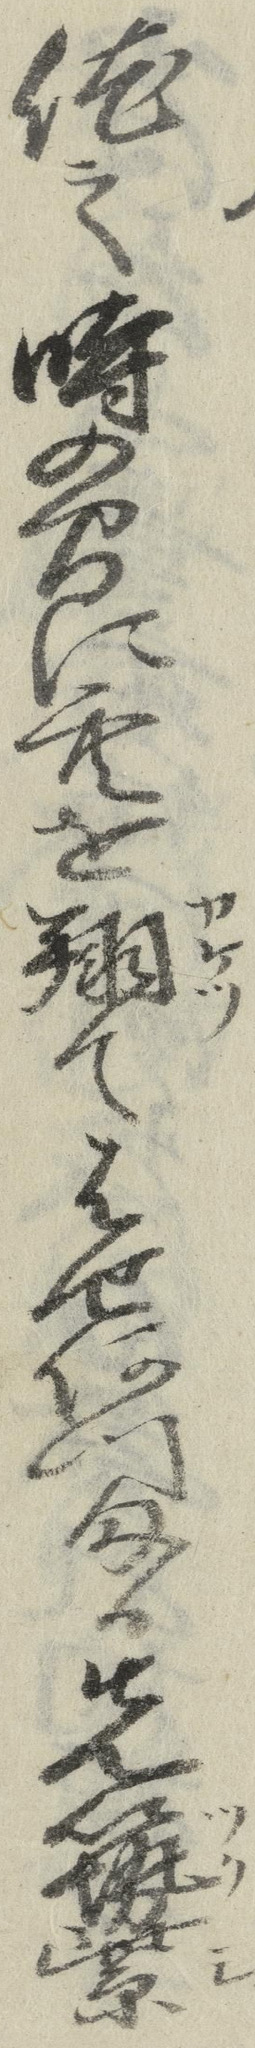依之時の間に雲を翔てはせあつまる先筑紫

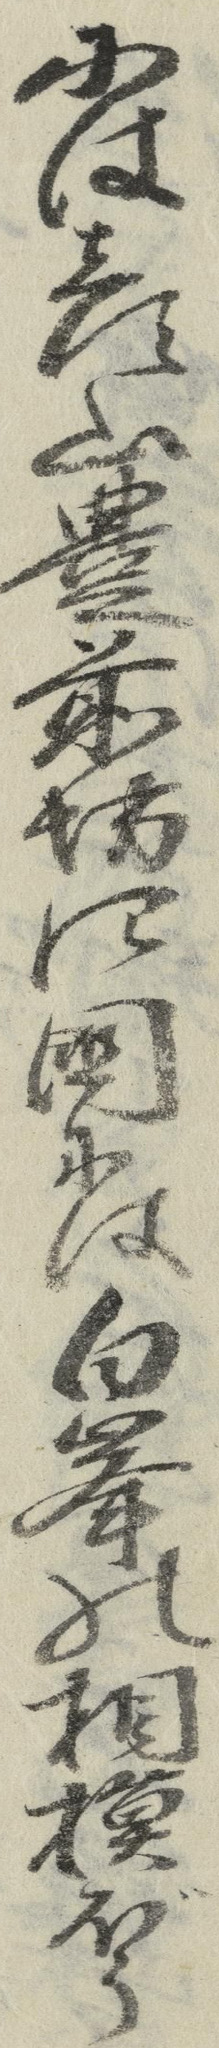には彦山豊前坊四国には白峯の相模ぼう
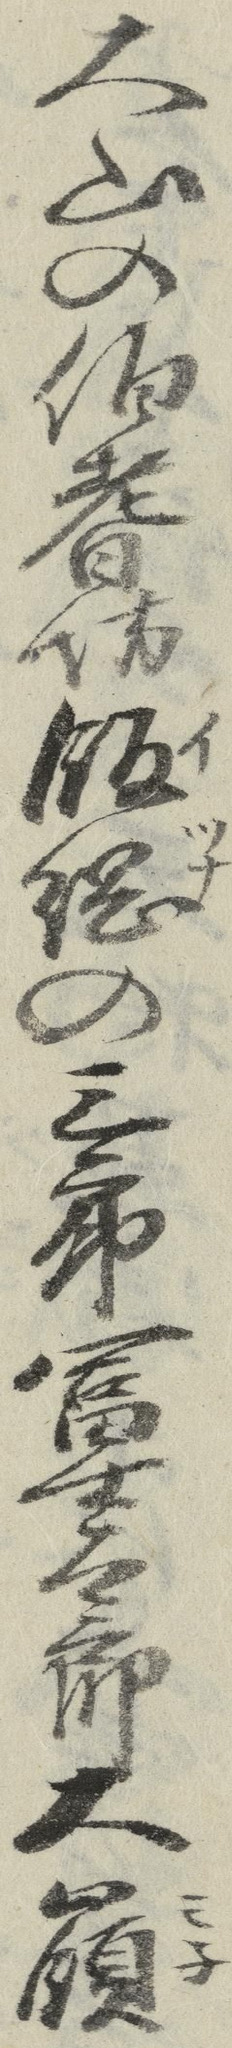大山の伯耆坊飯綱の三郎富士太郎大嶺
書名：浅間大焼騒動記　上
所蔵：東京大学地震研究所図書室 Earthquake Research Institute Library, The University of Tokyo, JAPAN
